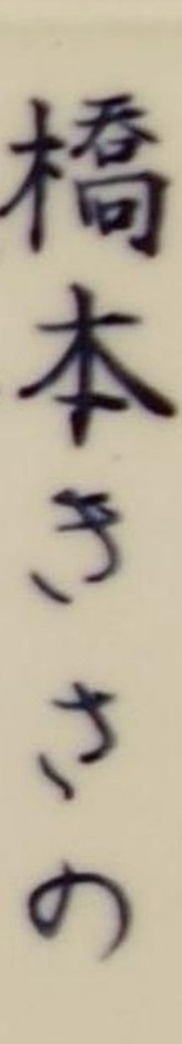橋本きさの
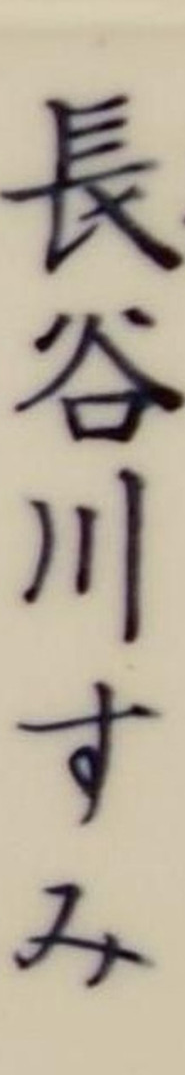長谷川すみ
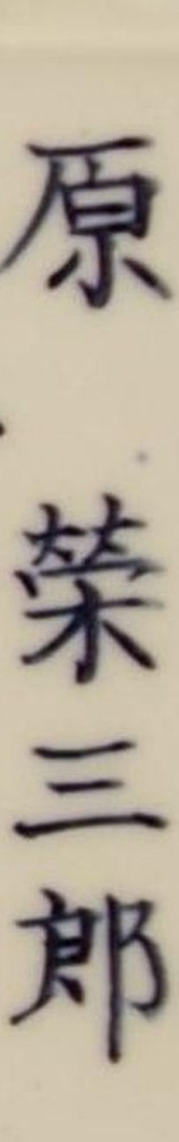原榮三郎
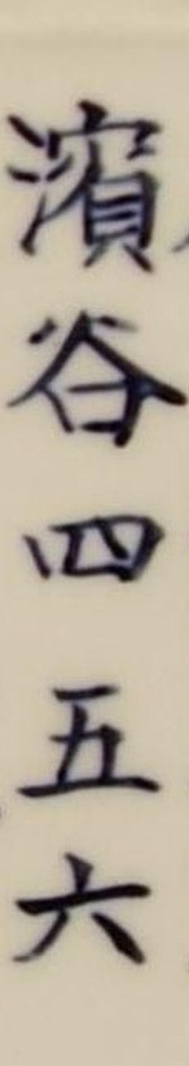浜谷四五六
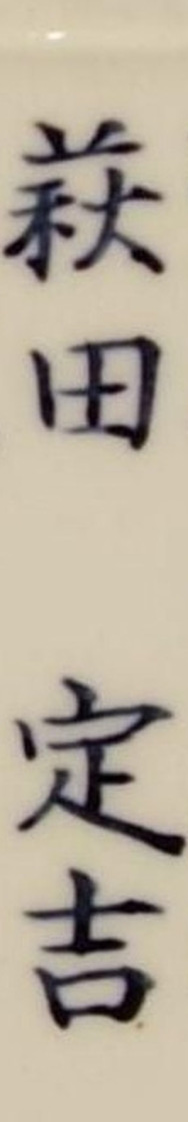萩田定吉
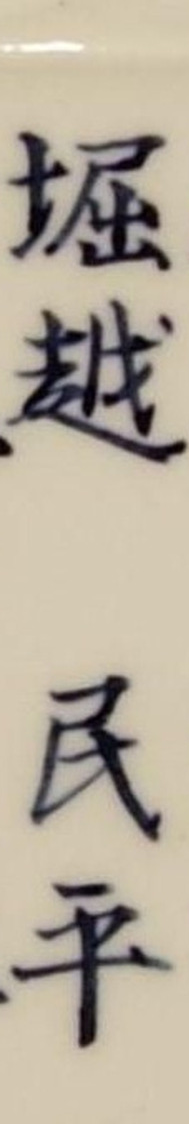堀越民平
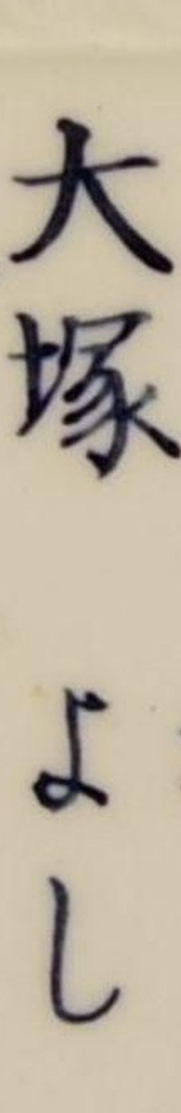大塚よし
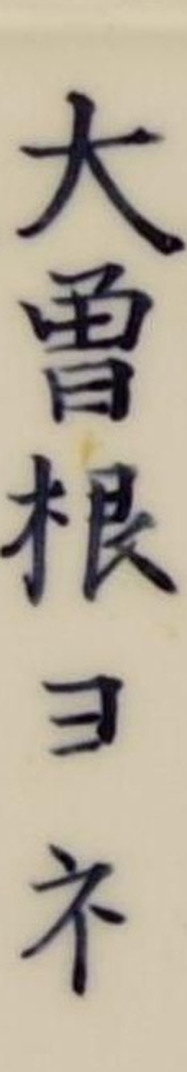大曽根ヨネ
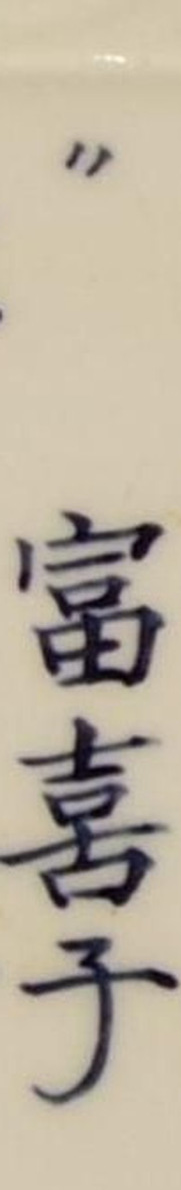富喜子
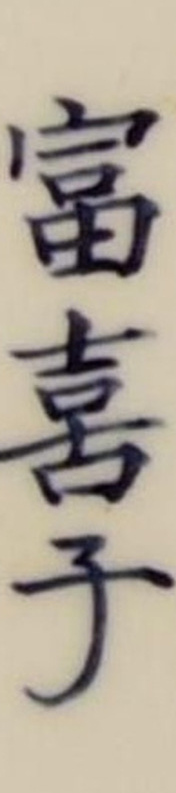富喜子
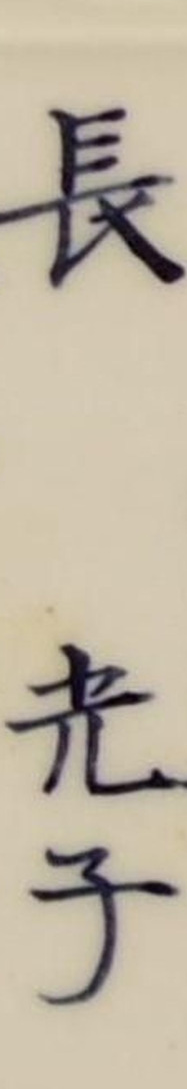長光子
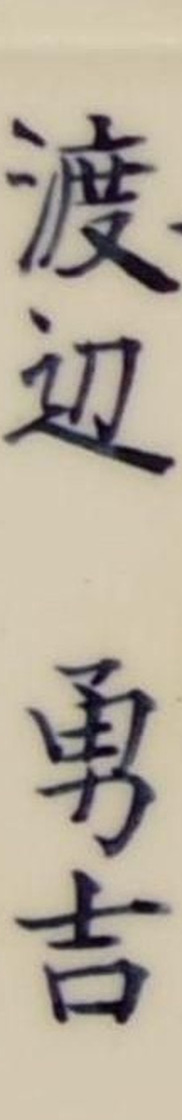渡辺勇吉

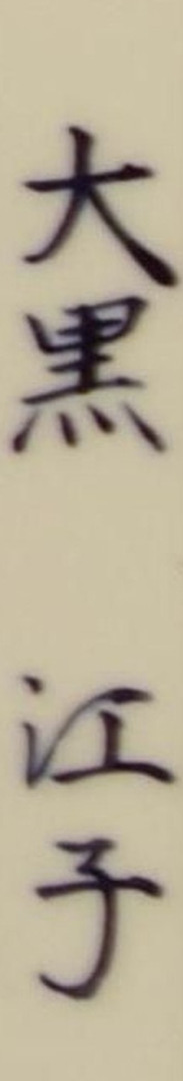大黒江子
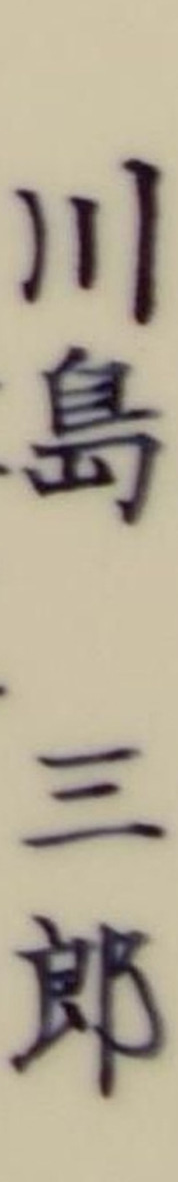川島三郎
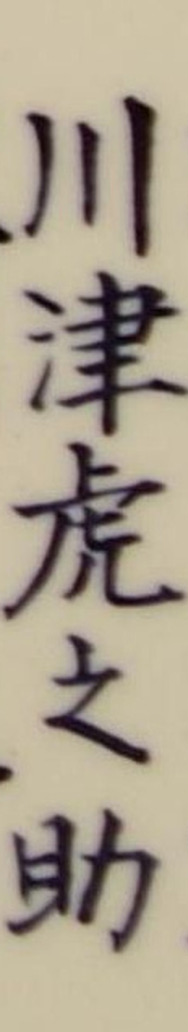川津虎之助
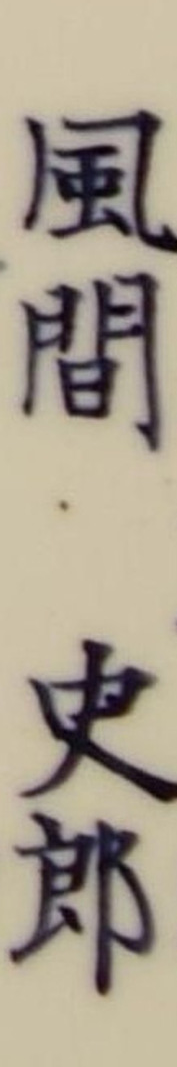風間史郎
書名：A~D
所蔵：koyasan kongobuji
